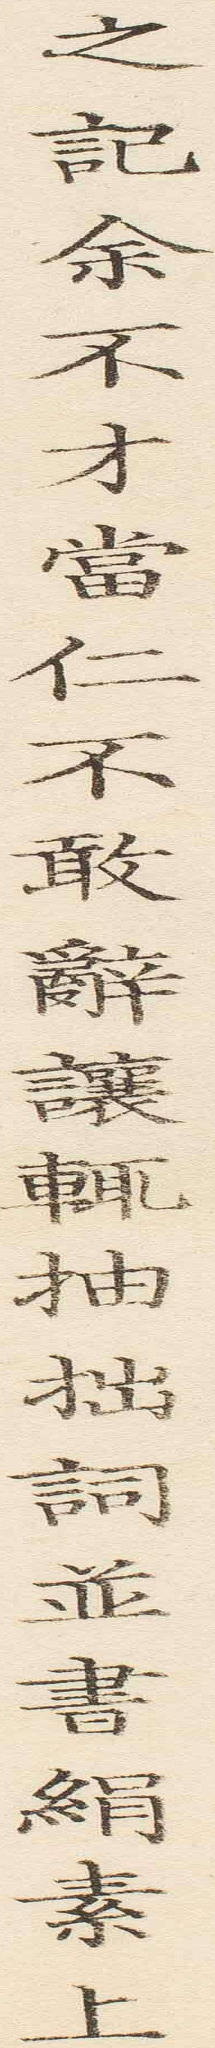之記余不才當仁不敢辭讓輒抽拙詞並書絹素上
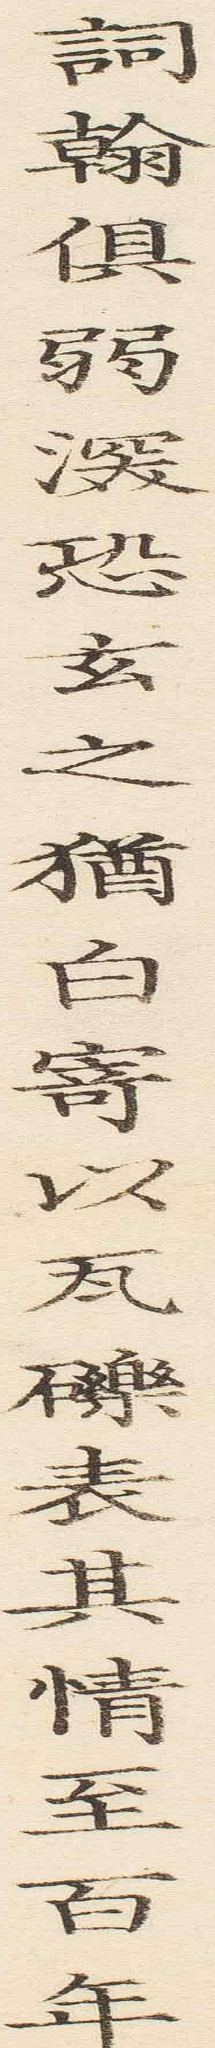詞翰俱弱㴱恐玄之猶白寄以瓦礫表其情至百年
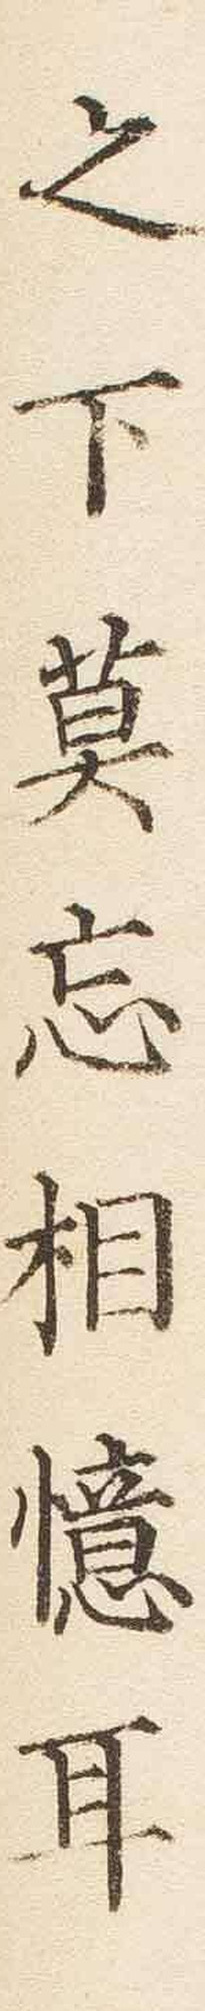之下莫忘相憶耳
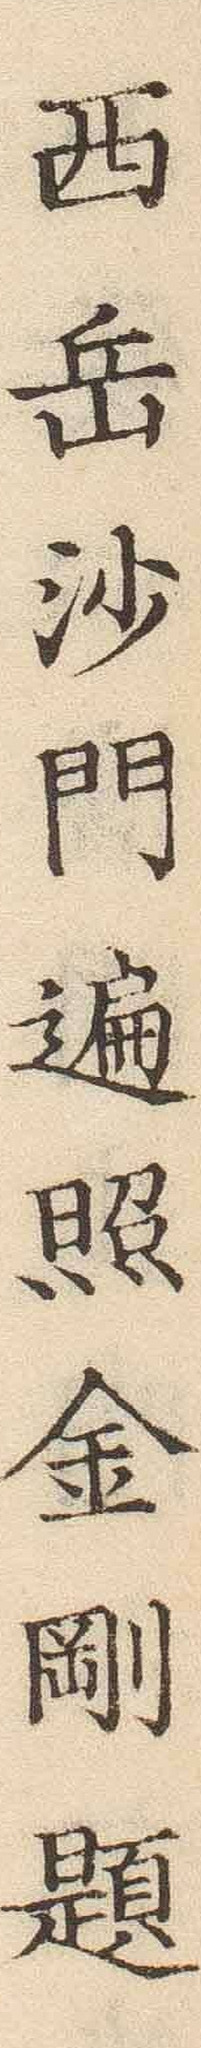西岳沙門遍照金剛題
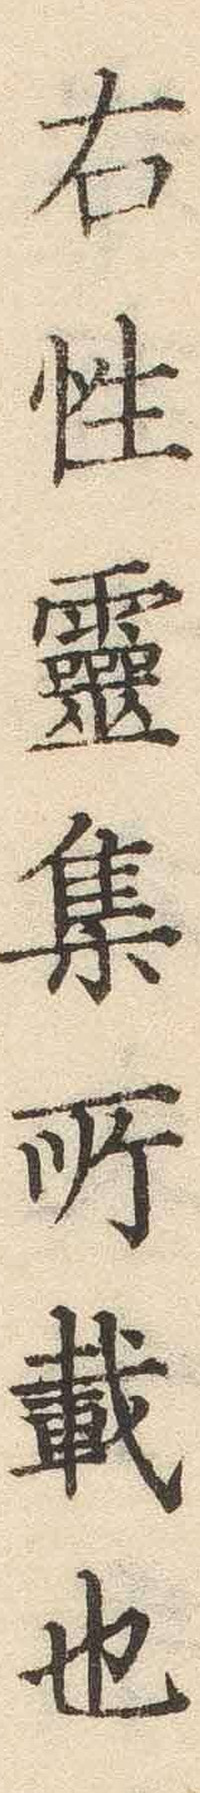右性靈集所載也
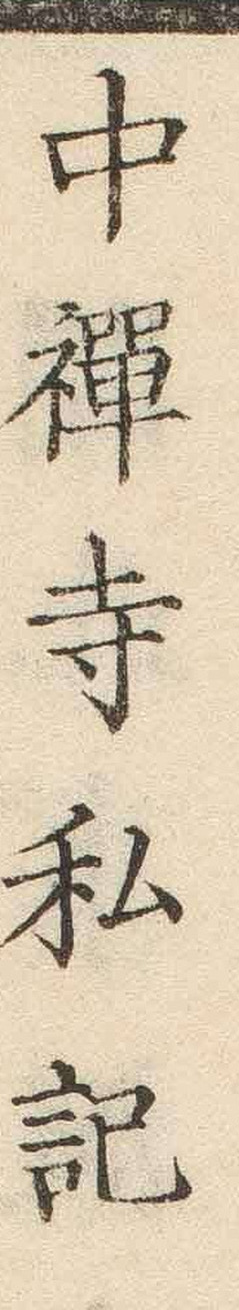中禪寺私記
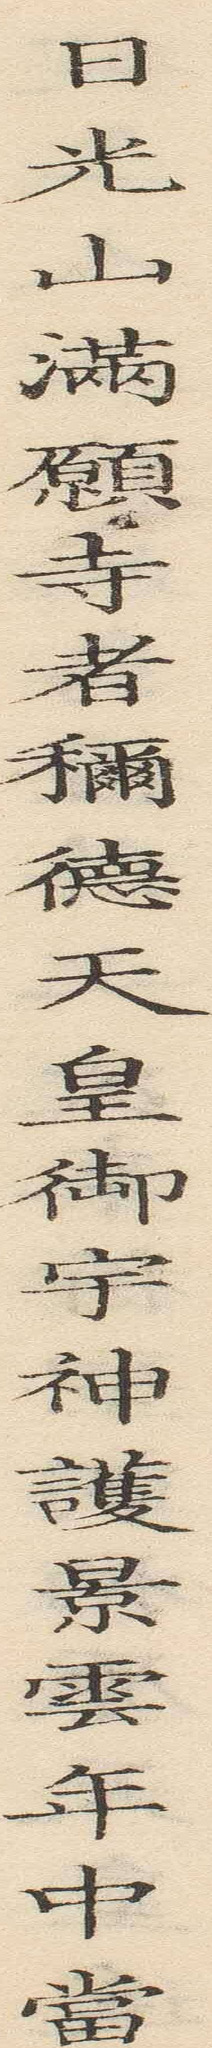日光山滿願寺者穪德天皇御宇神護景雲年中當
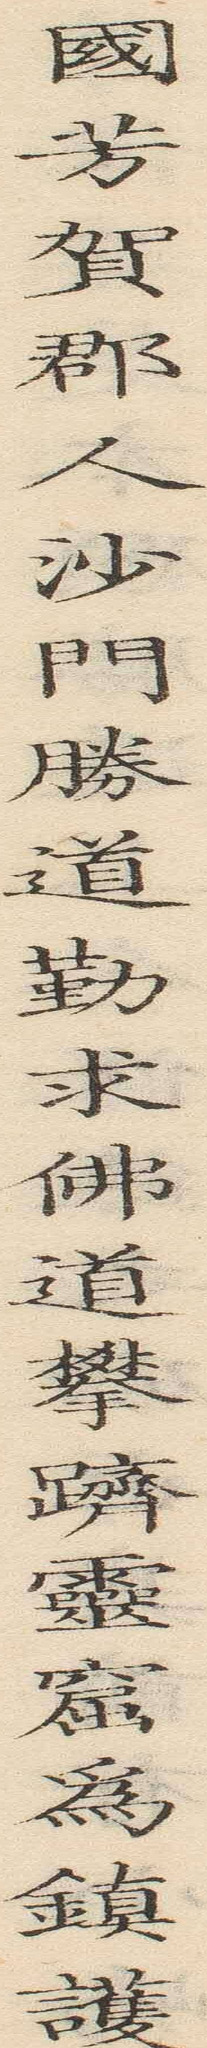國芳賀郡人沙門勝道勤求佛道攀躋靈窟爲鎮護
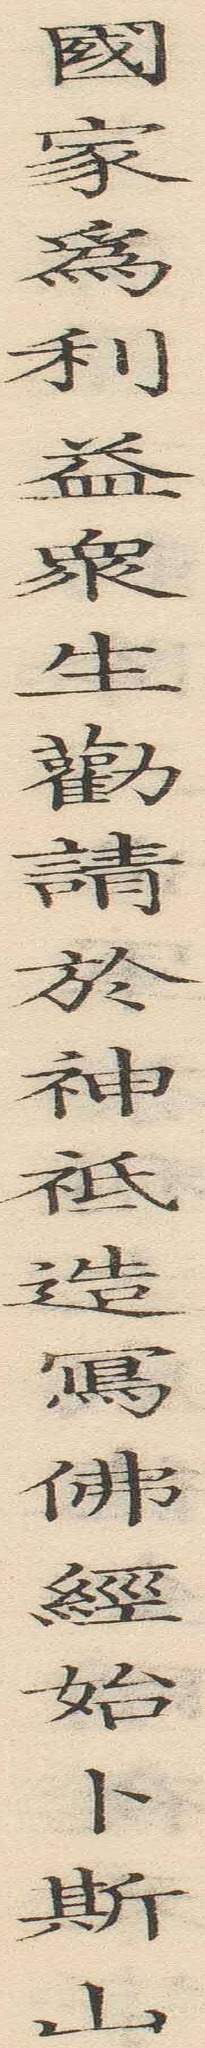國家爲利益衆生勸請於神祗造冩佛經始卜斯山
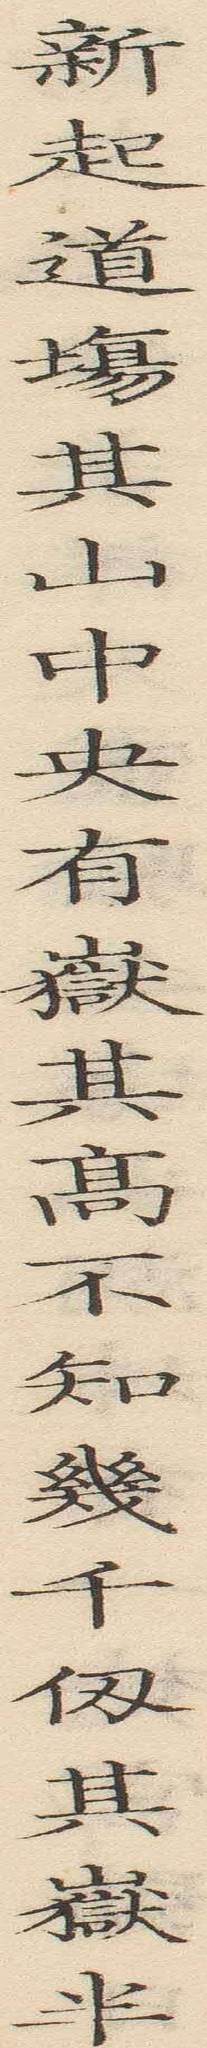新起道塲其山中央有嶽其髙不知幾千仭其嶽半
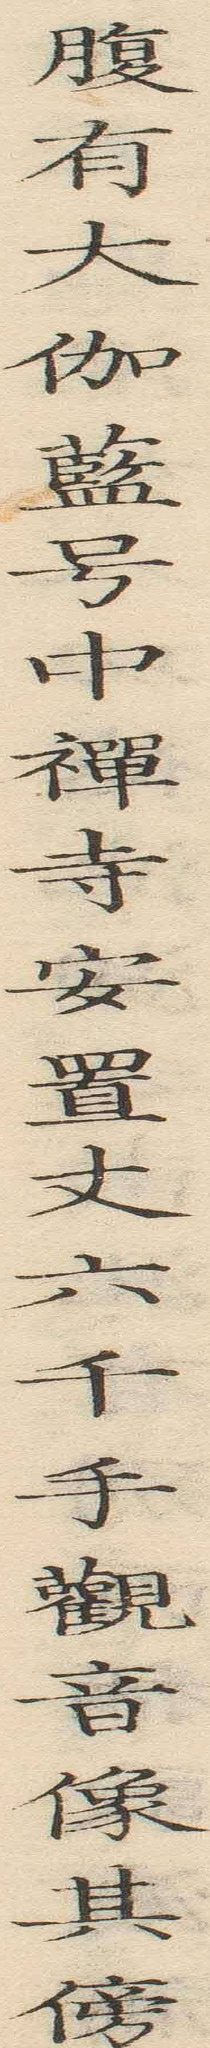腹有大伽藍号中禪寺安置丈六千手觀音像其傍
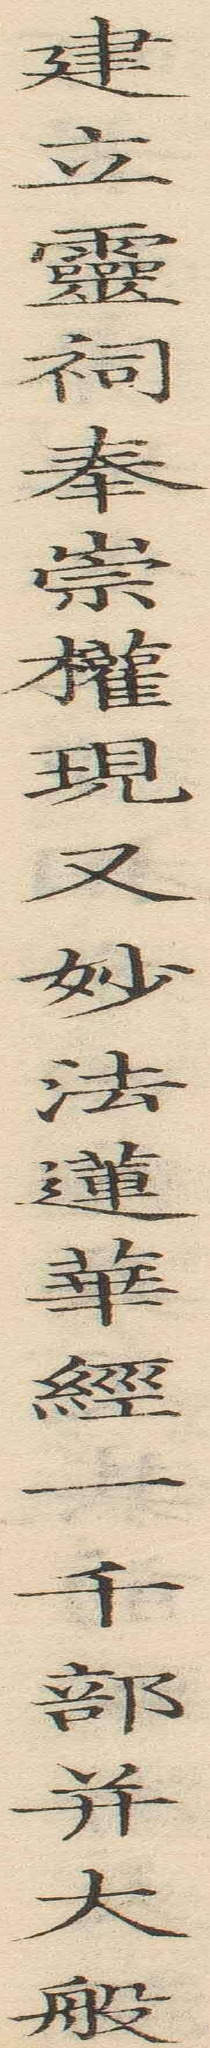建立靈祠奉崇權現又妙法蓮華經一千部并大般
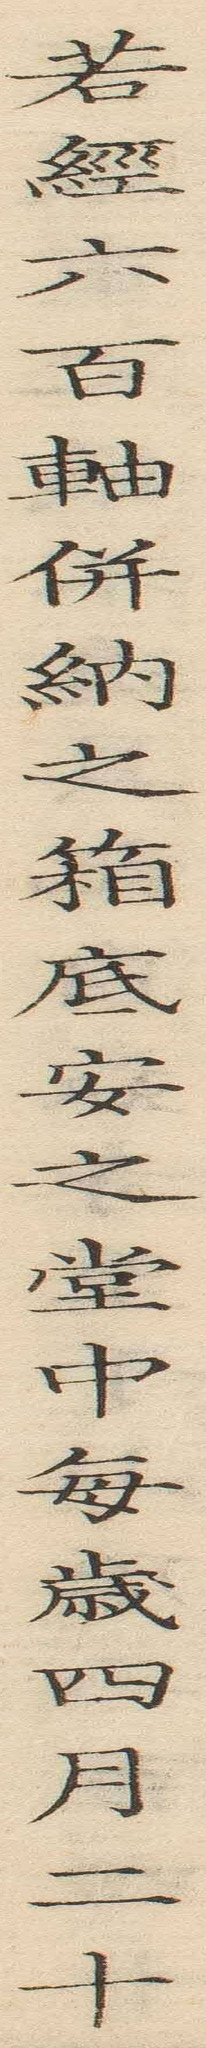若經六百軸併納之箱底安之堂中每歳四月二十
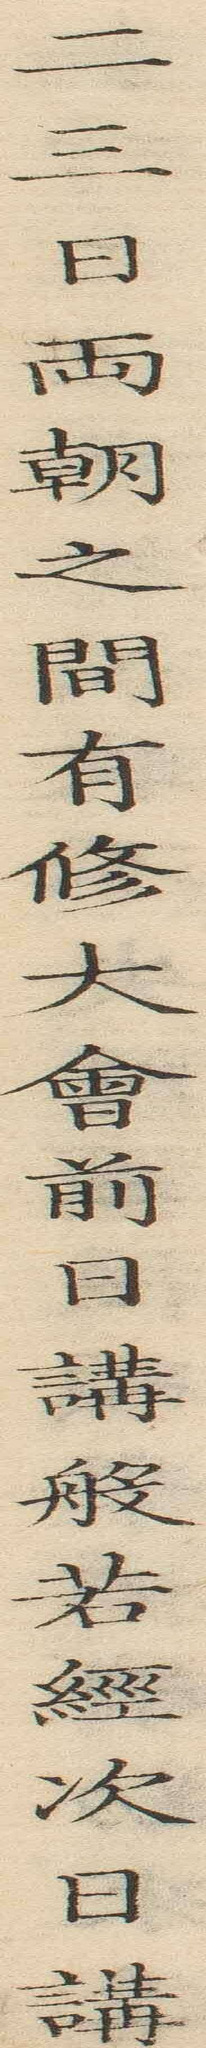二三日両朝之間有修大會前日講般若經次日講
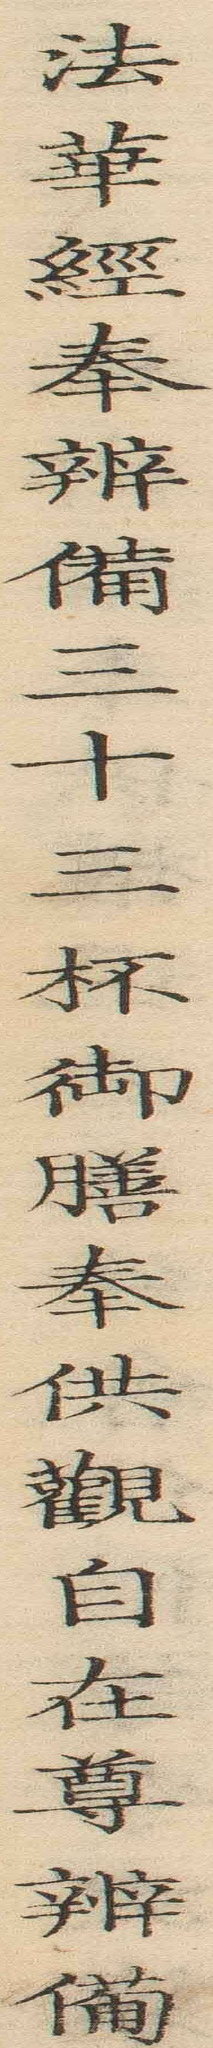法華經奉辨備三十三杯御膳奉供觀自在尊辨僃

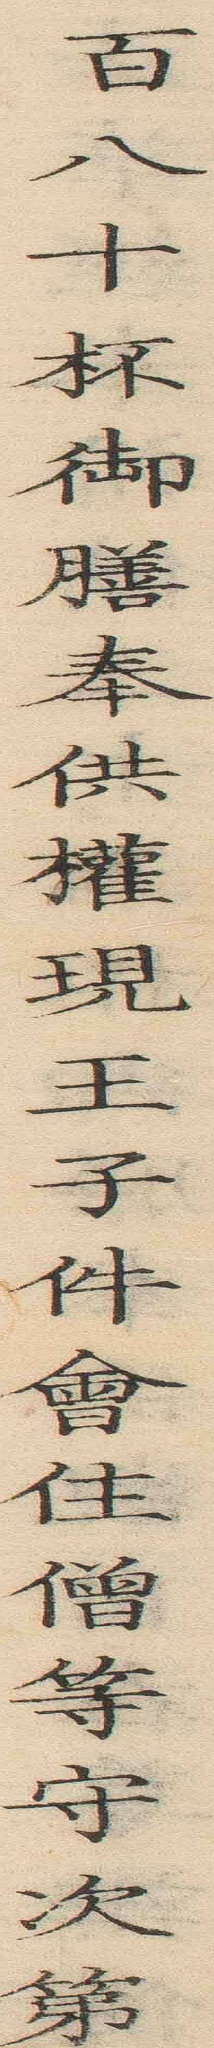百八十杯御膳奉供權現王子件會住僧等守次第
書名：日光山志
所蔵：東京学芸大学附属図書館 国文学研究資料館
